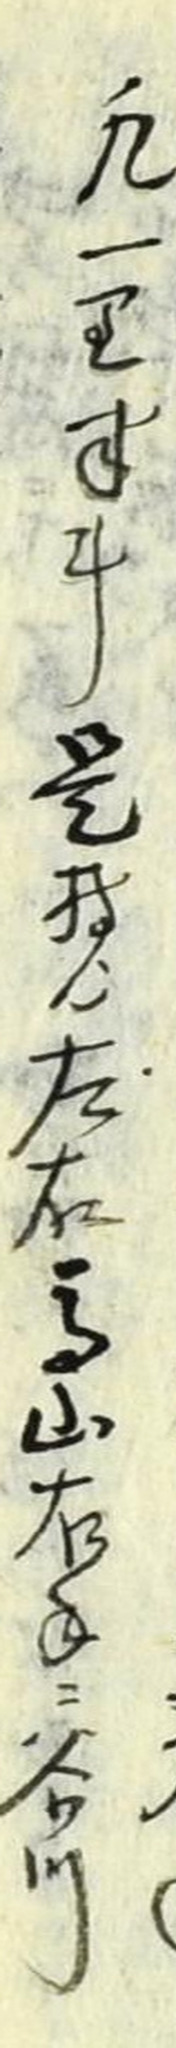凡一里半計是村ゟ左右高山右手ニ谷川
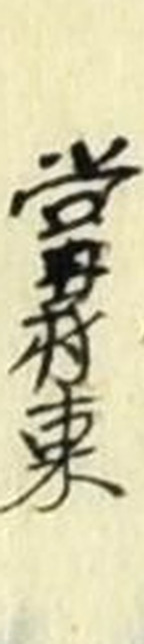当村東
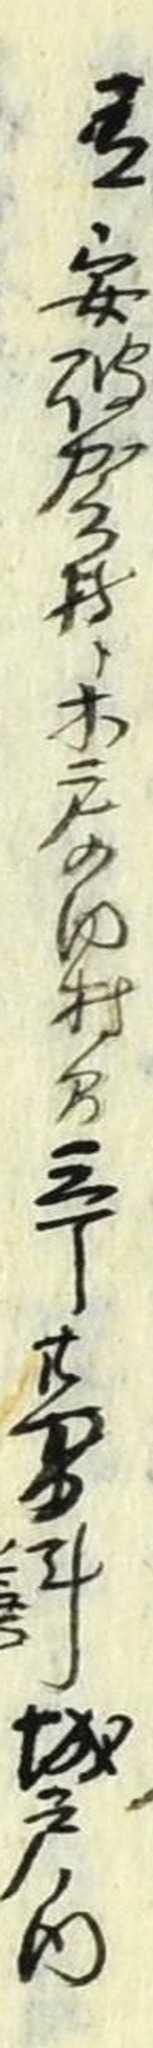有安破賀村と木戸の内村間三丁廿間計城戸ノ内
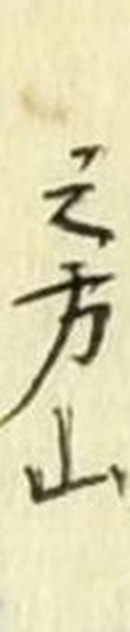之方山
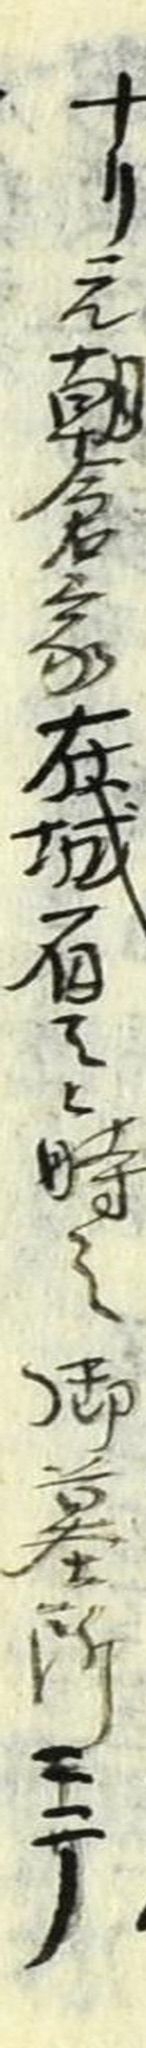ナリ元朝倉家在城有之候時之御墓所ニテ
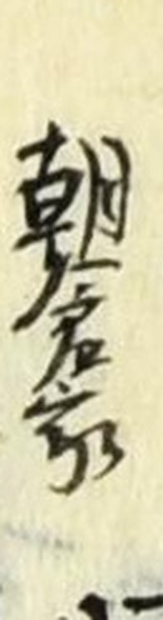朝倉家
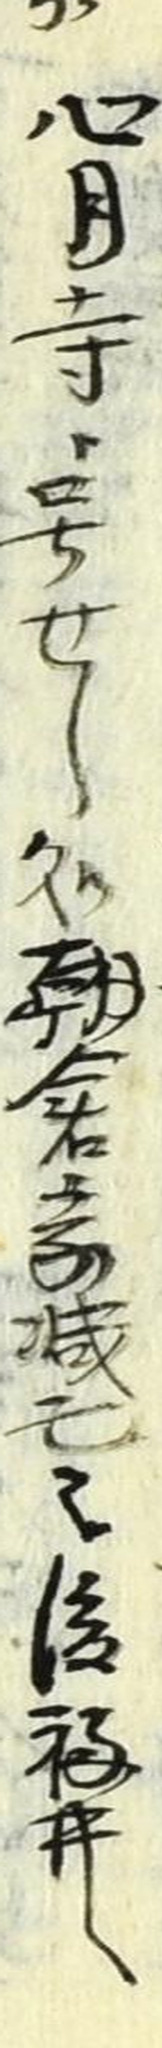心月寺ト号せし処朝倉家滅亡之後福井へ
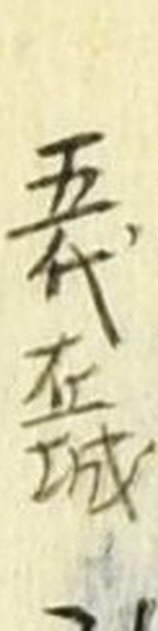五代在城
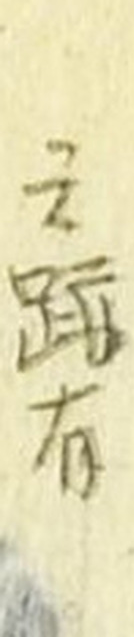之跡有
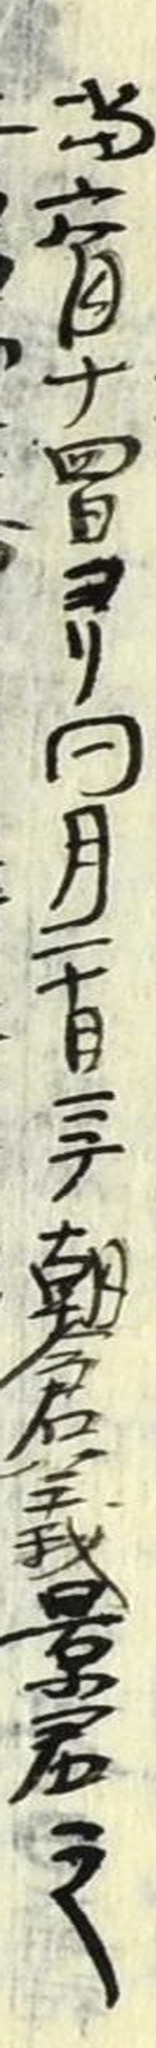当六月十四日ヨリ同月二十日にて朝倉義景君之
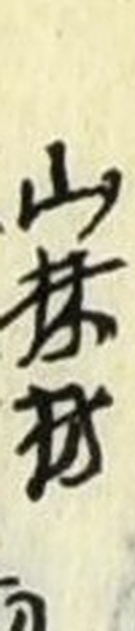山林材
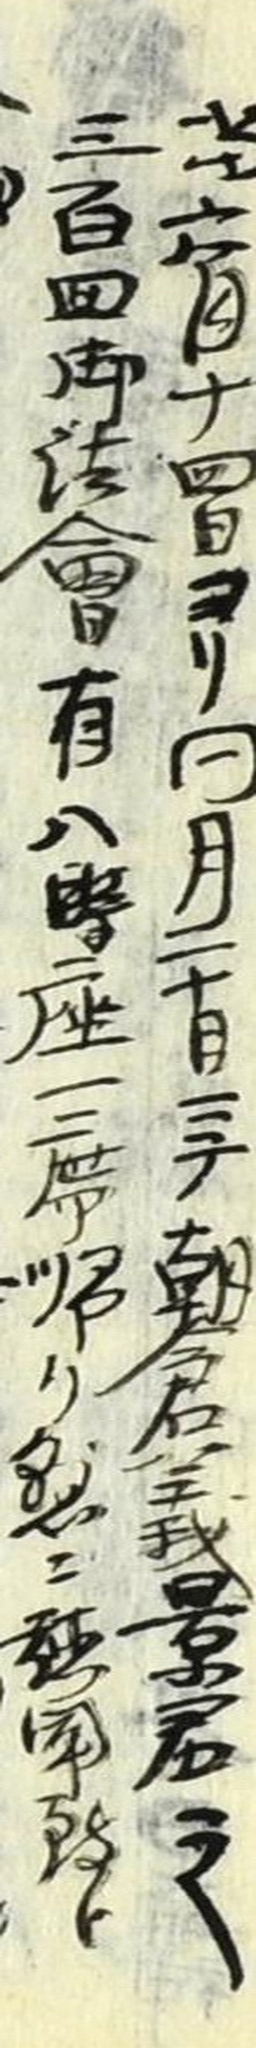三百回御法会有八時座一席帰り懸ニ聴聞致候
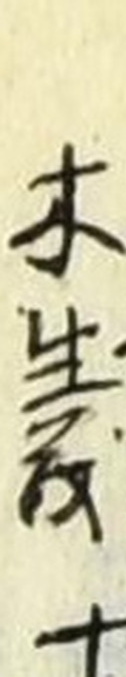木生茂
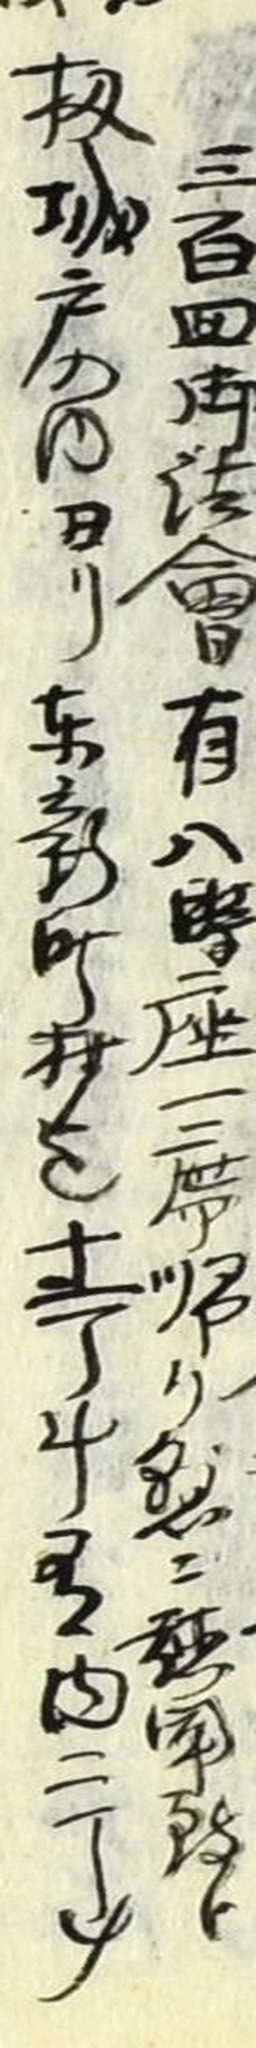扨城戸の内ヨリ東新町村迄十一丁計有内二丁計
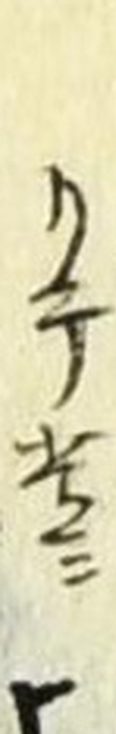リテ常ニ
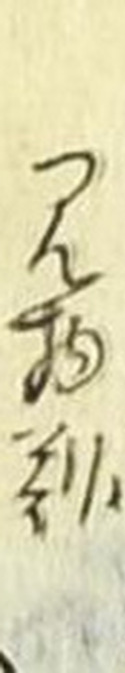見物難
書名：（日記）
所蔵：福井県文書館 Fukui Prefectural Archives
